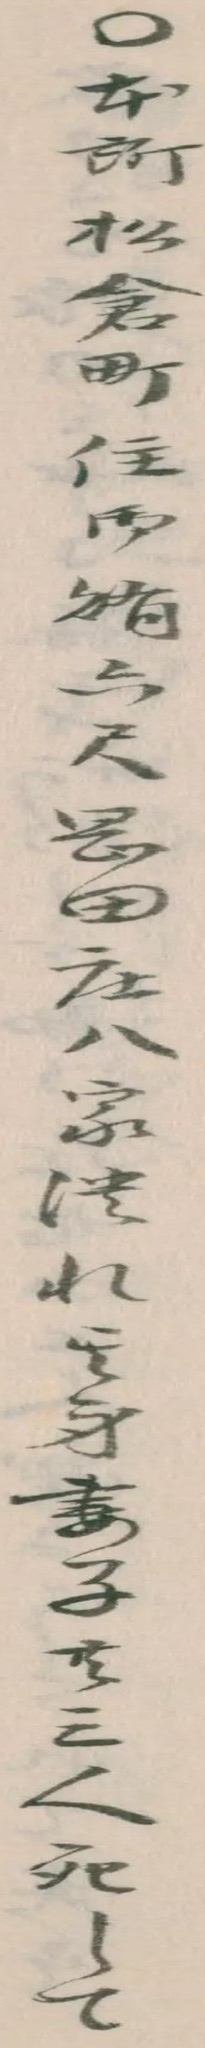〇本所松倉町住御賄六尺岡田庄八家潰れ其身妻子共三人死して
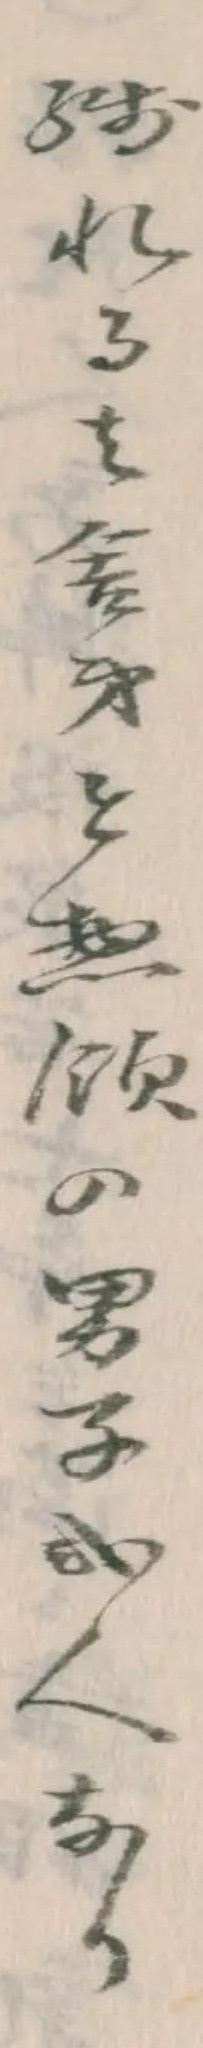残れるは舎弟と惣領の男子弐人なり
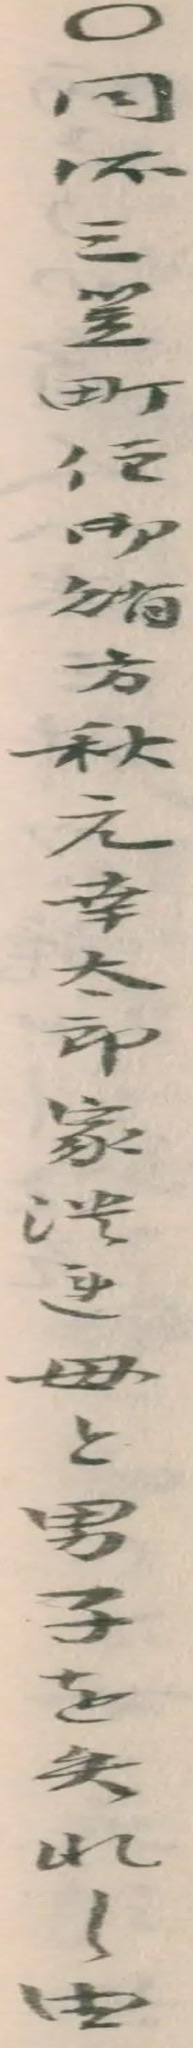〇同所三笠町住御賄方秋元幸太郎家潰れ母と男子を失れし由
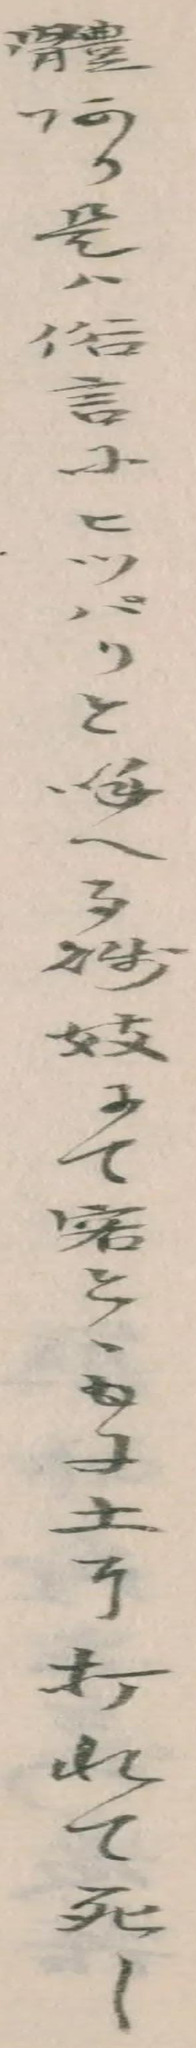体あり是は俗言にヒツパリと呼へる賎妓にて客とゝもに土に打れて死し
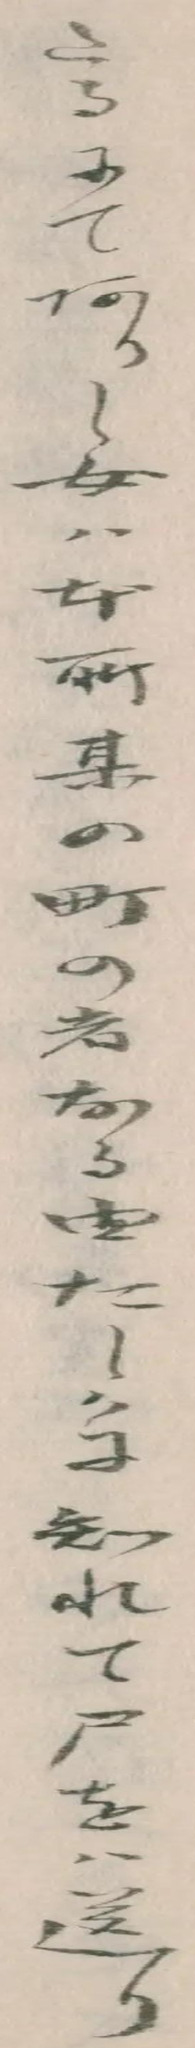たるにてありし女は本所某の町の者なる由たしかに知れて尸をは送り
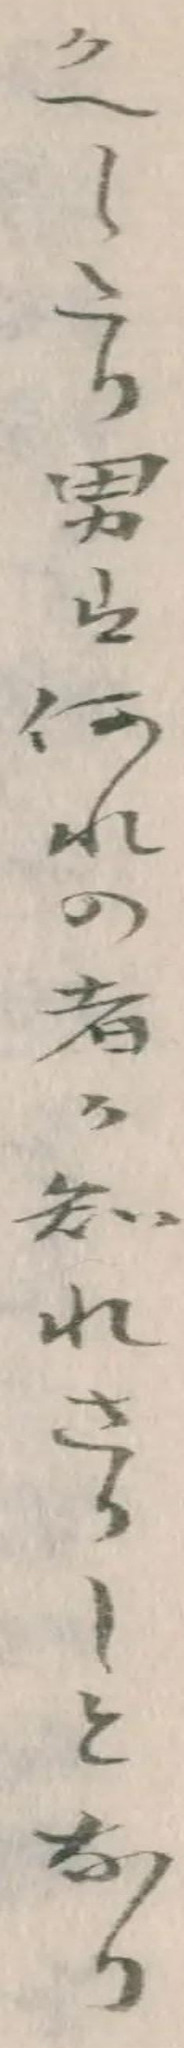かへしたり男は何れの者か知れさりしとなり
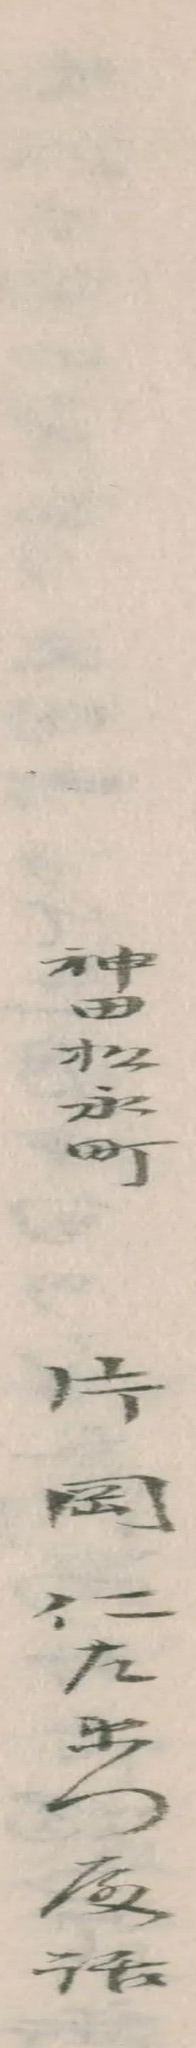神田松永町片岡仁左衛門殿話
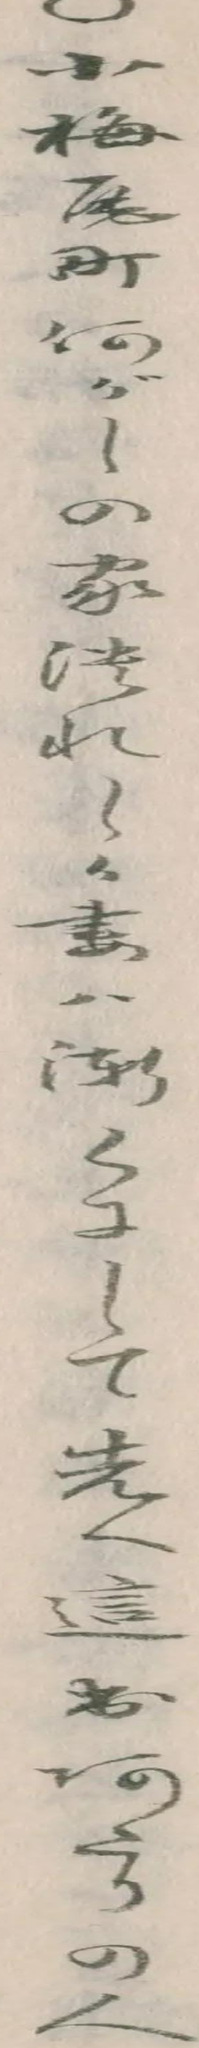〇小梅瓦町何がしの家潰れしか妻は漸くにして先へ這出あたりの人
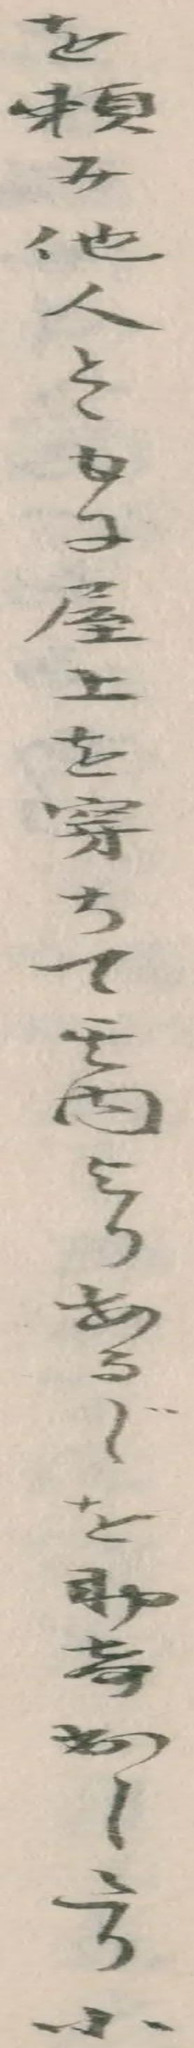を頼み他人とゝもに屋上を穿ちて其内よりあるじを助け出したり小
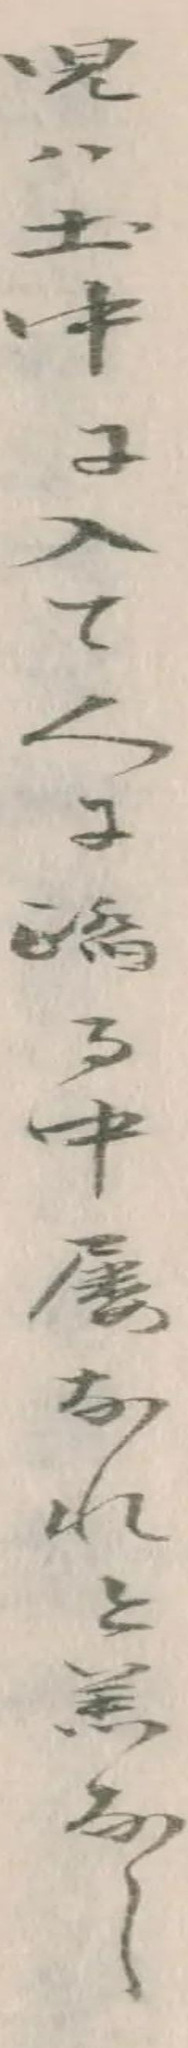児は土中に入て人に踏る中屡なれと恙なし

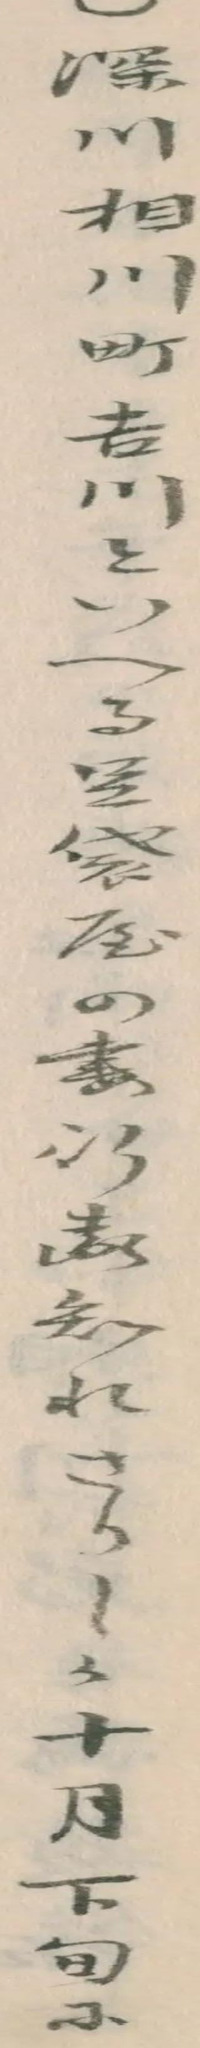〇深川相川町吉川といへる足袋屋の妻行ゑ知れさりしか十月下旬に
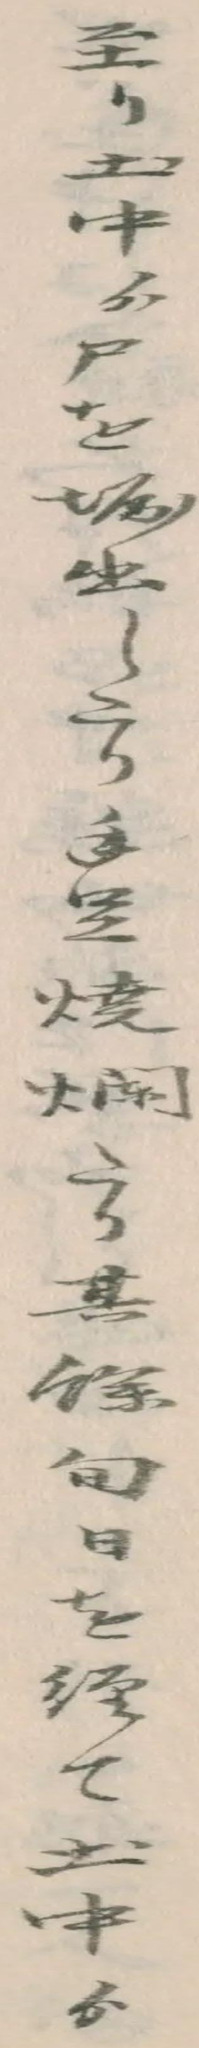至り土中ゟ尸を掘出したり手足焼爛たり其余旬日を経て土中ゟ
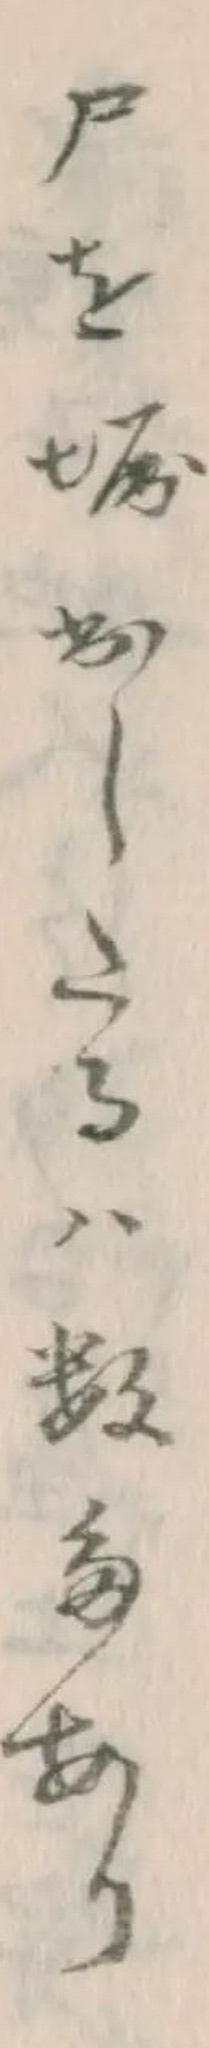尸を掘出したるは数多あり
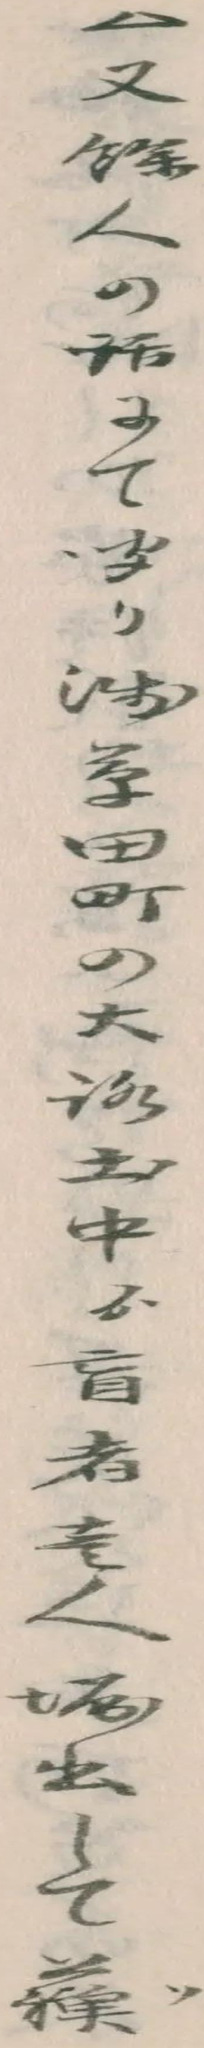△又余人の話にて聞り浅草田町の大路土中ゟ盲者壱人掘出して蘇
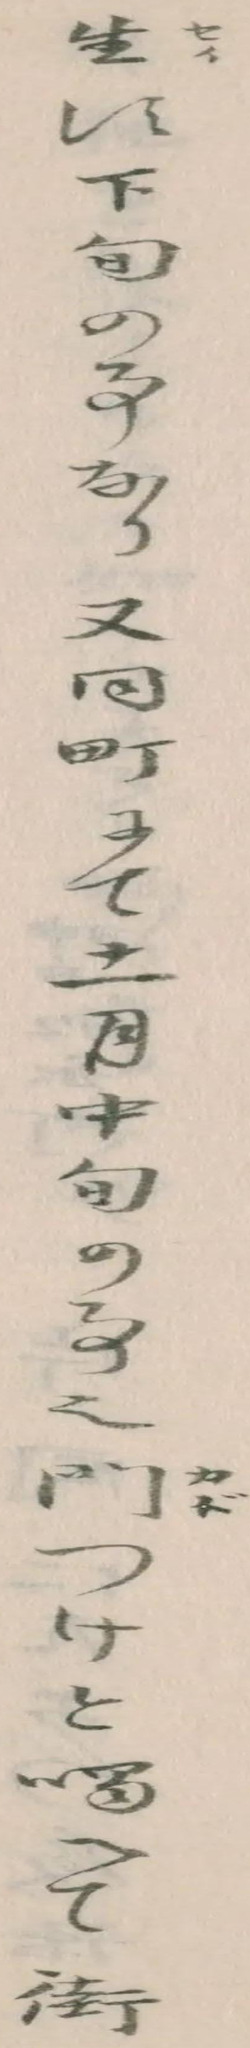生す下旬の事なり又同町にて十一月中旬事也門つけと唱へて街
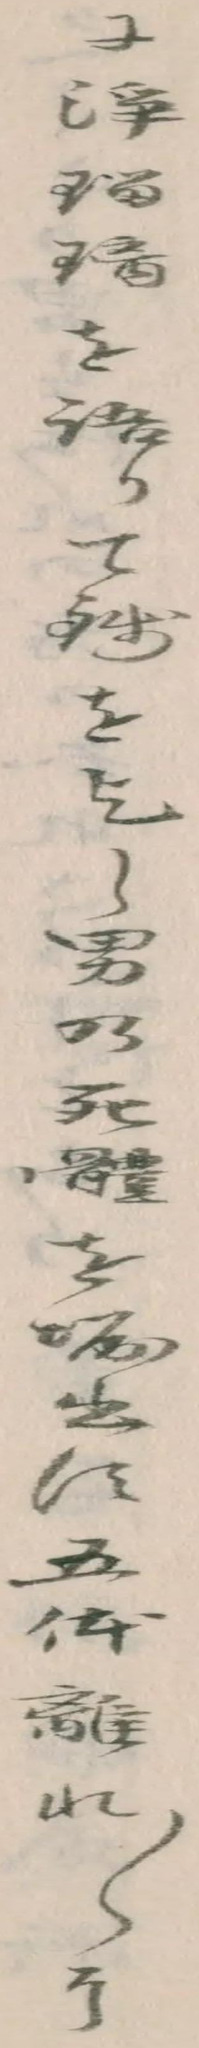に浄瑠璃を語りて銭を乞し男の死体を掘出す五体離れ〳〵に
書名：地災撮要. 巻7-9(地震之部)
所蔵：国立国会図書館 National Diet Library, JAPAN
